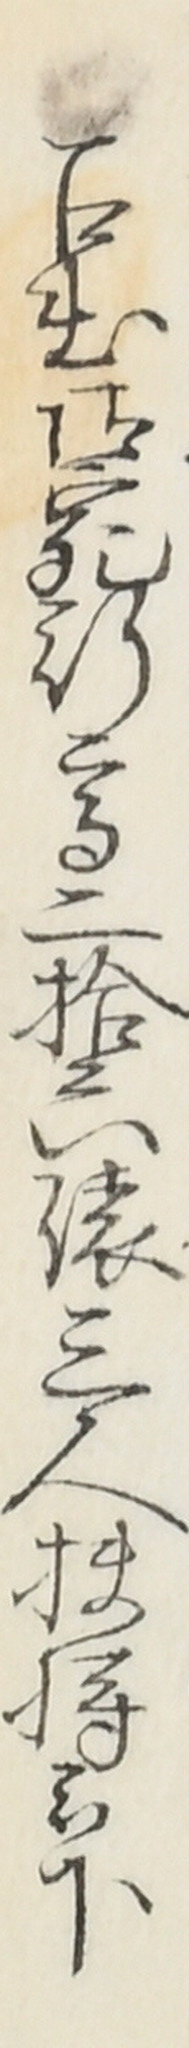召出御宛行高二拾六俵三人扶持被下
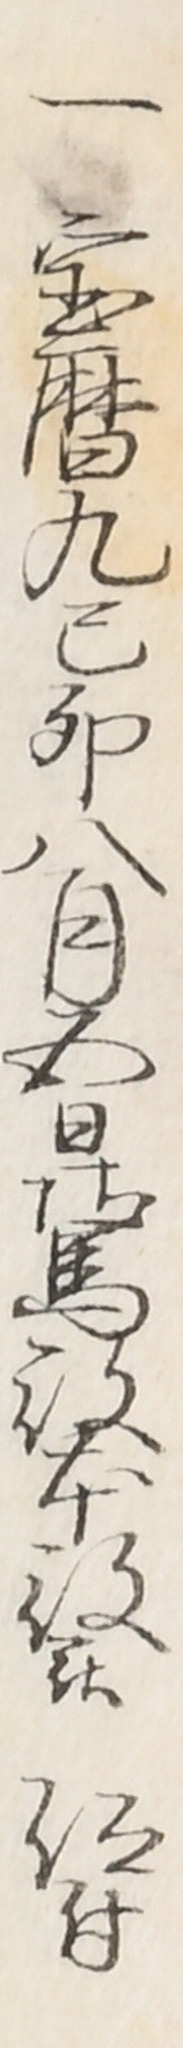一宝暦九己卯八月五日御馬役本役被仰付
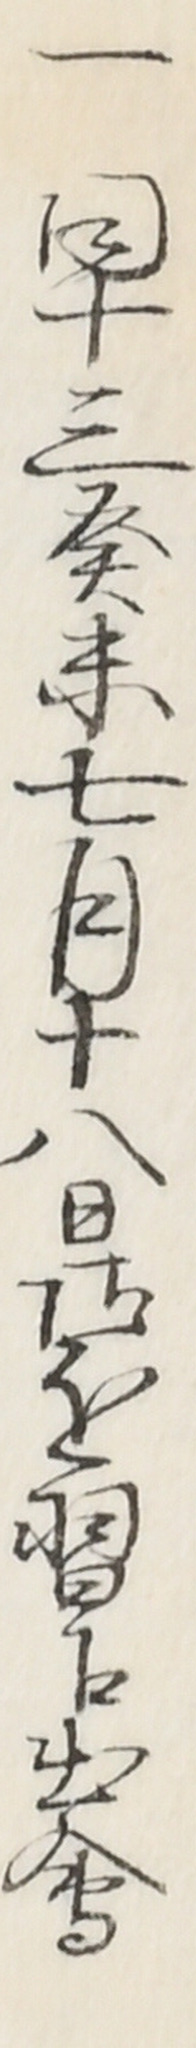一同十三癸未七月十八日御近習江召出会
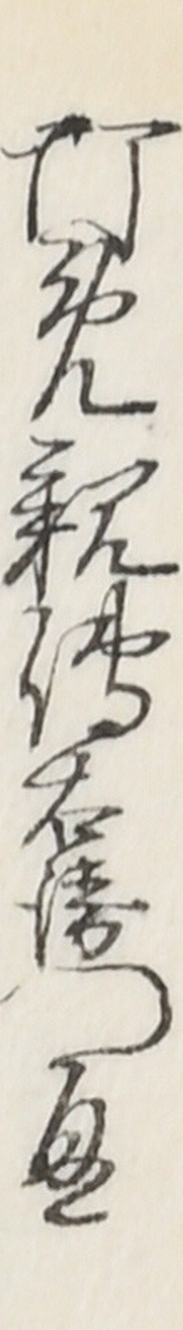御免親伝右衛門通
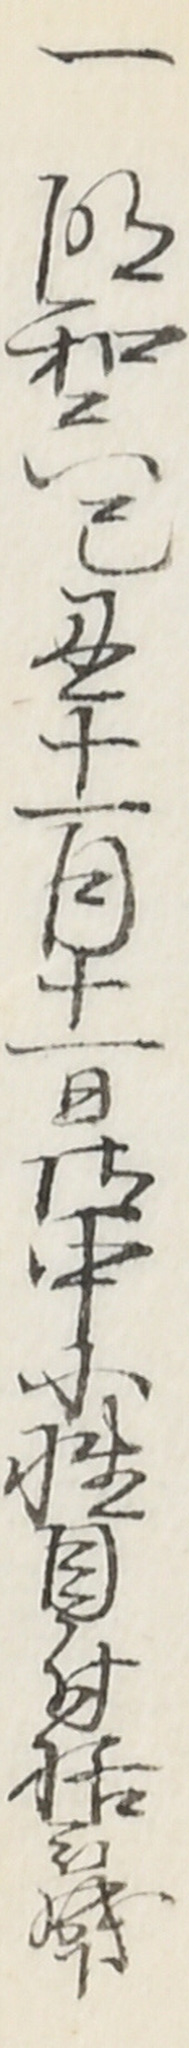一明和六己丑十一月十一日御中小性目付格被成下
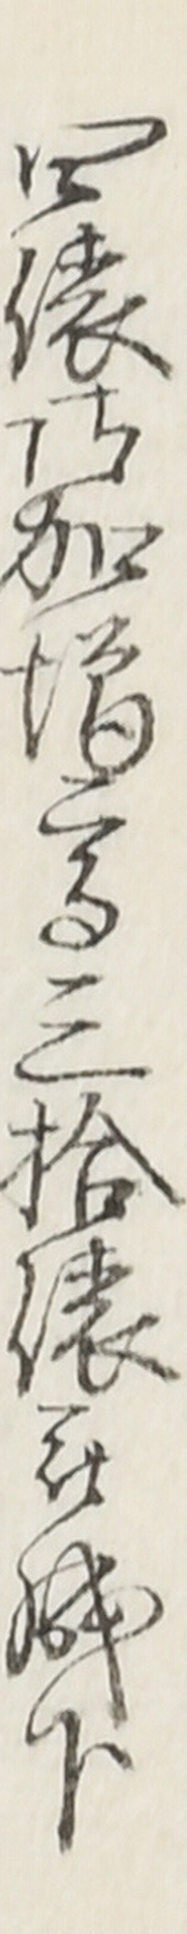四俵御加増高三拾俵被成下
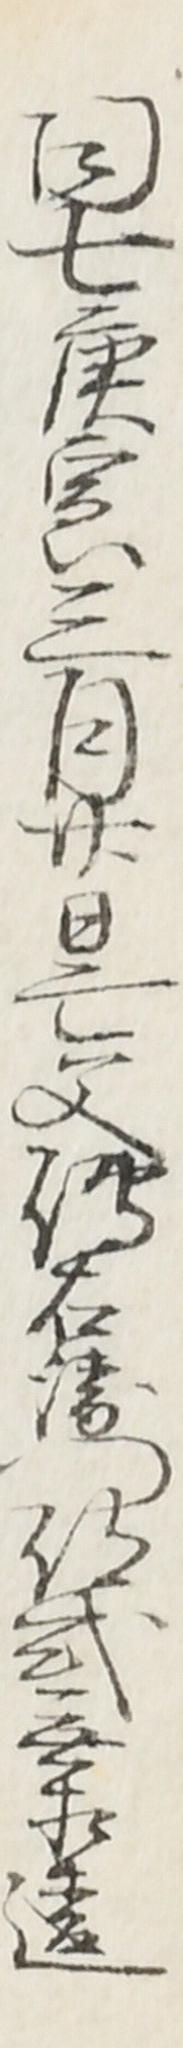一同七庚寅三月廿日亡父伝右衛門跡式無相違
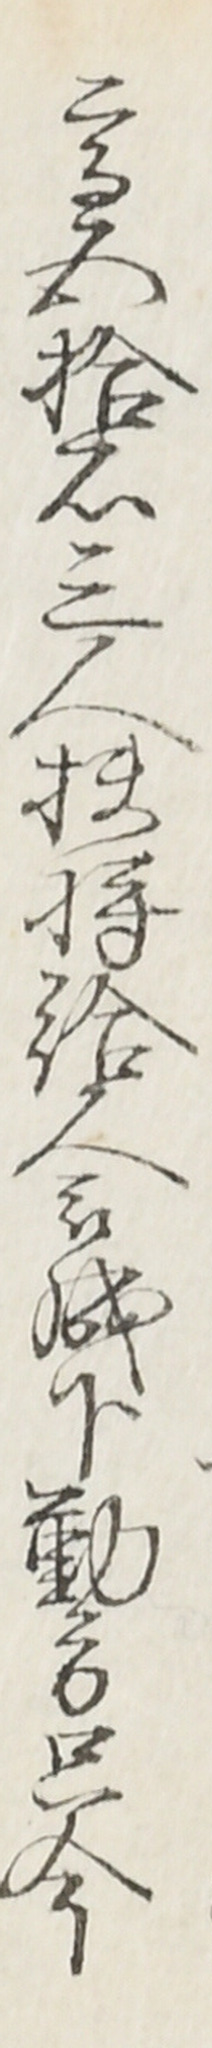高五拾石三人扶持給人被成下勤方只今
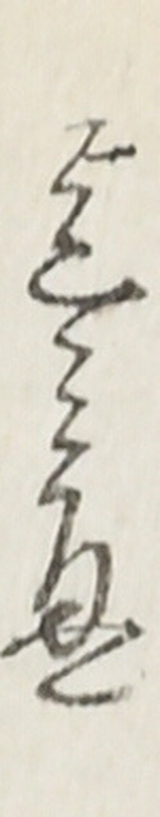迄之通
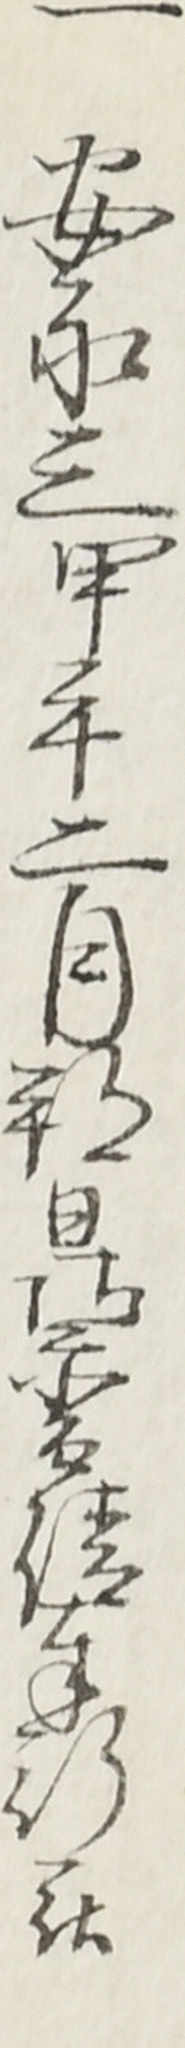一安永三甲午二月朔日御普請奉行被
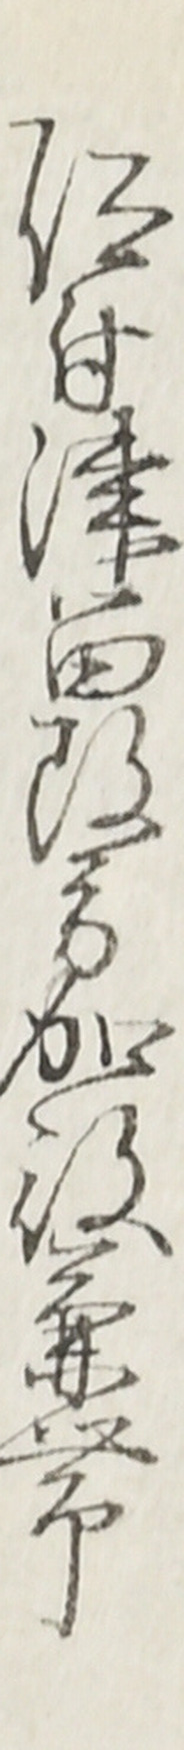仰付津留改方加役兼帯
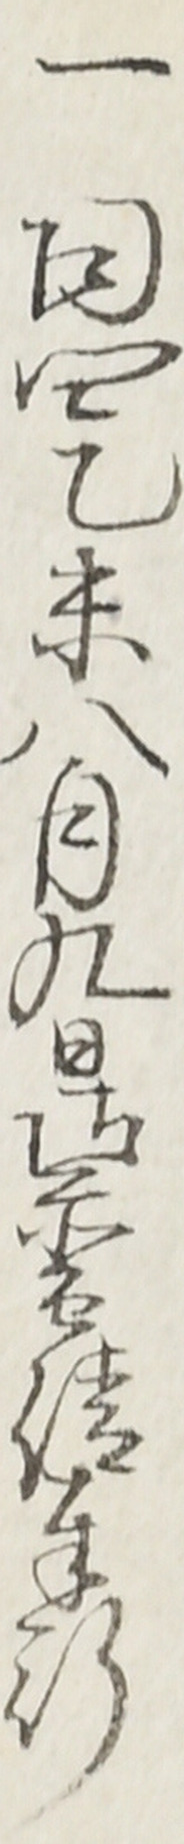一同四乙未八月九日御普請奉行
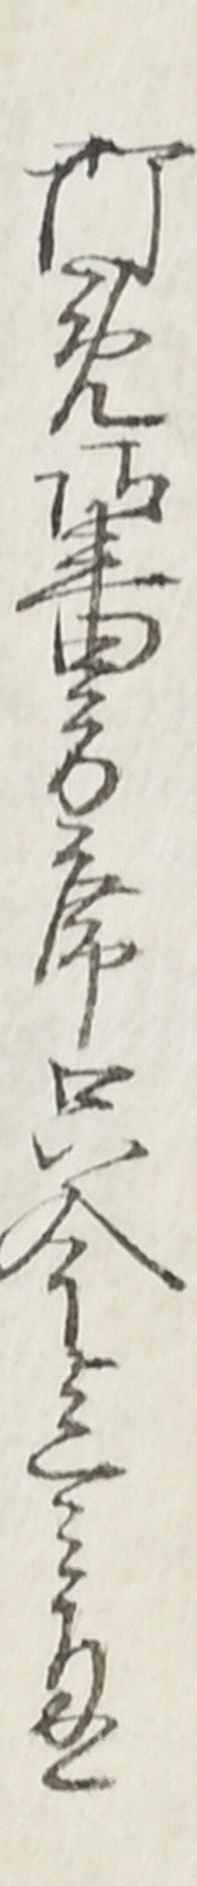御免御番方席只今迄之通
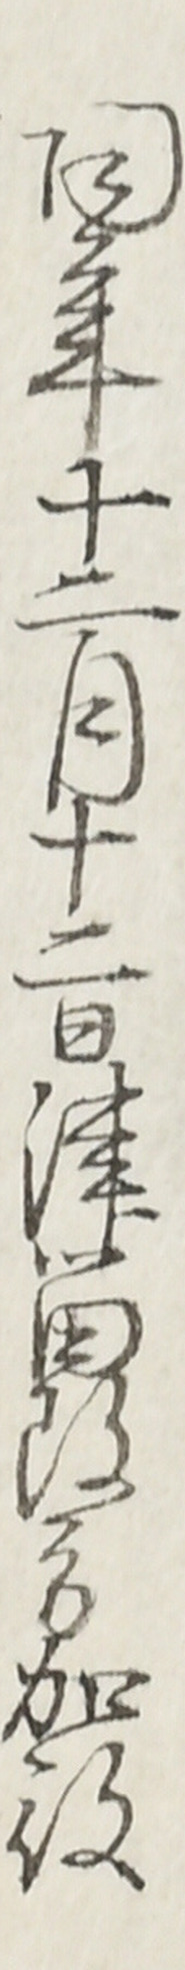一同年十二月十二日津留改方加役
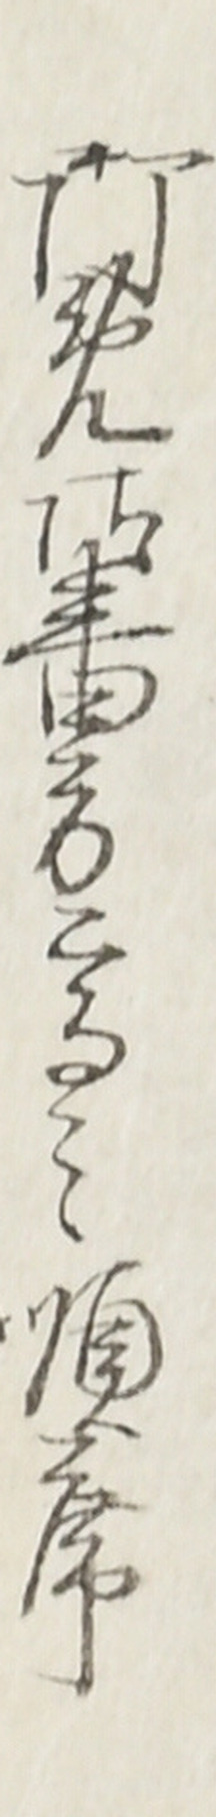御免御番方高之順席
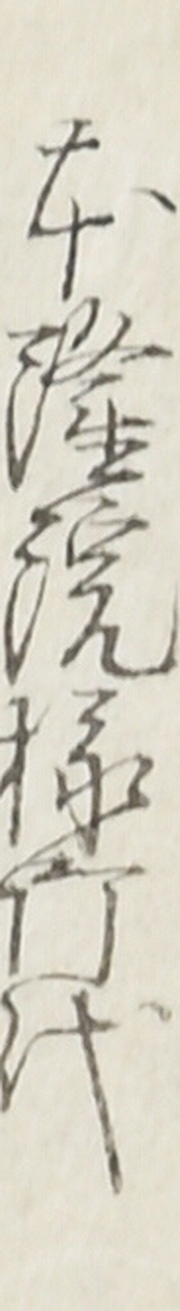本隆院様御代
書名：給人諸士勤仕録（七）
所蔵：伊那市立高遠町図書館・合同会社AMANE
